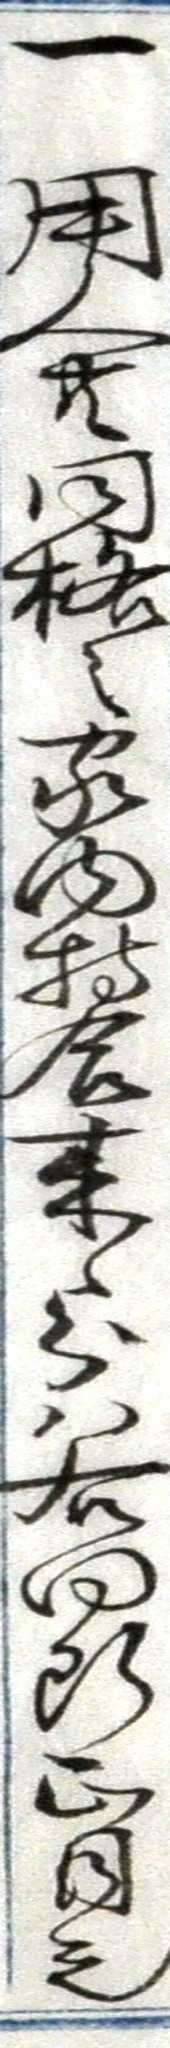一用人共同格之家内持合来候分ハ右同断正月元
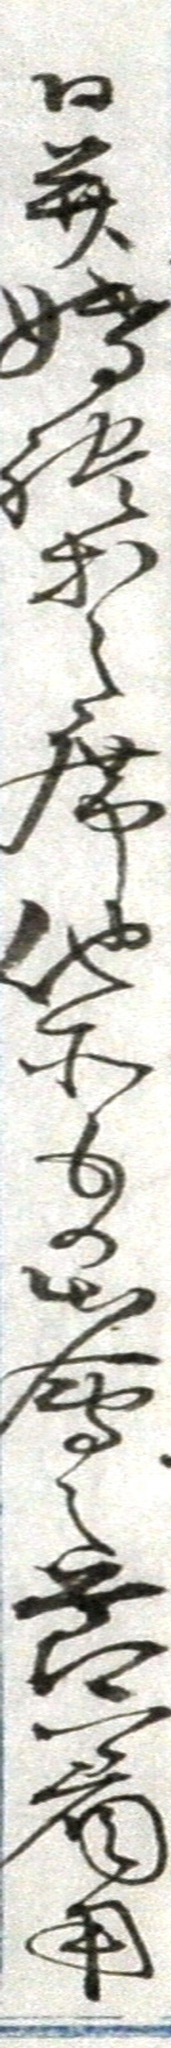日并婚礼等之席他所もの出会之節着用
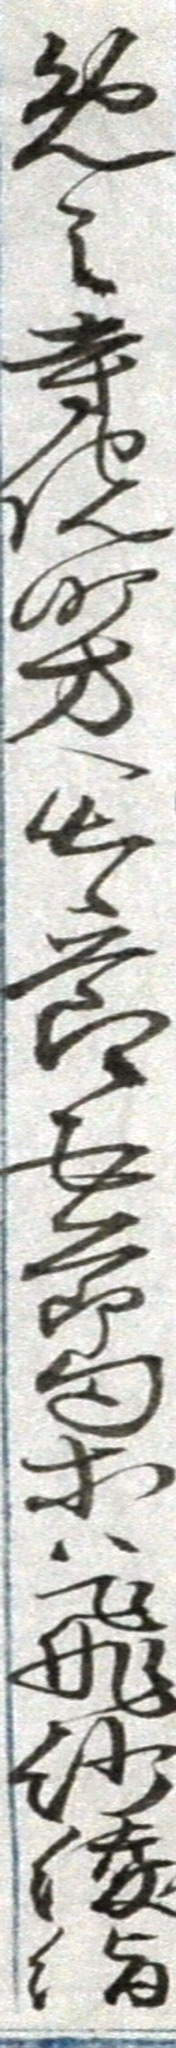免之寺院町方へ出候節五節句等ハ飛紗綾絹
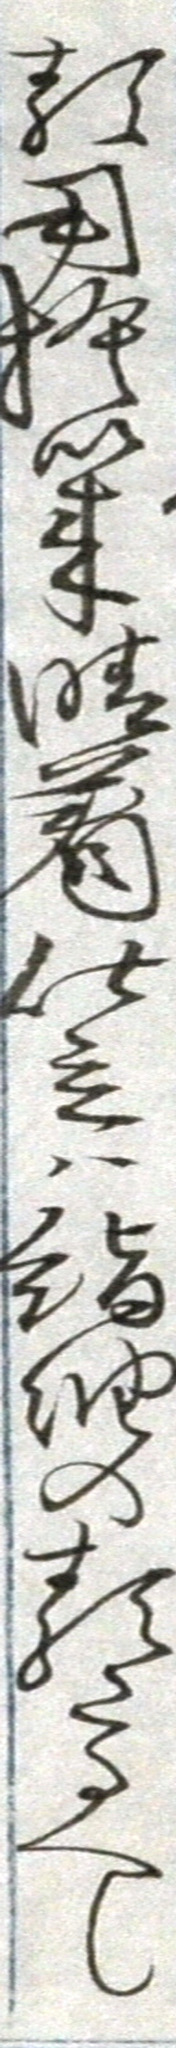類用捨以来晴着仕立ハ絹紬の類たるへし
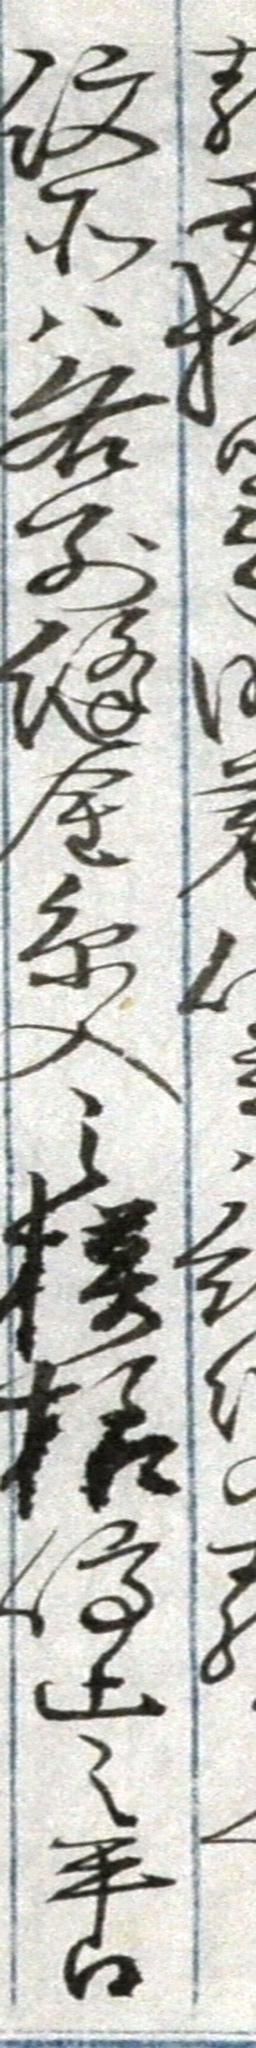紋所ハ各別縫金糸入之模様停止之平日
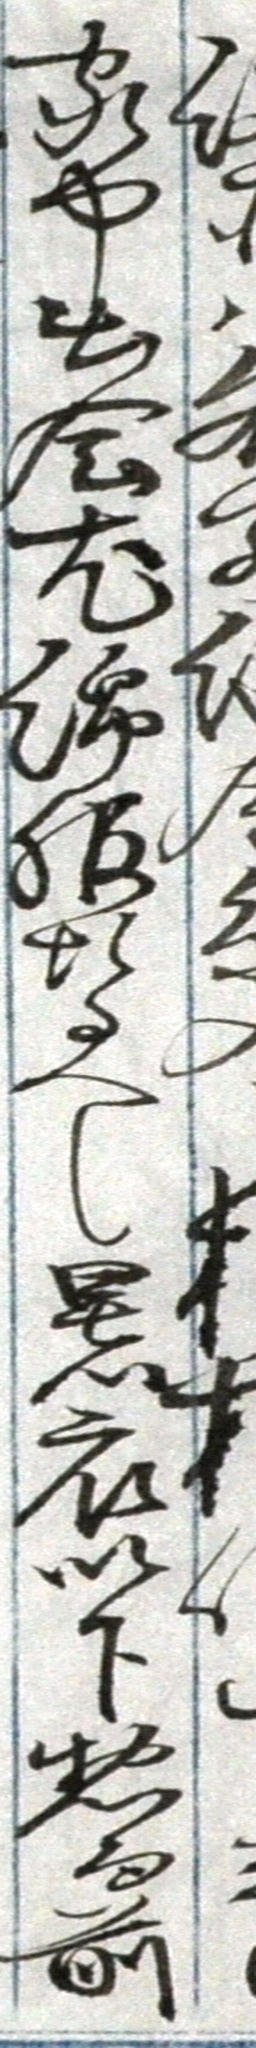家中出会尤綿服たるへし暑衣以下惣而前
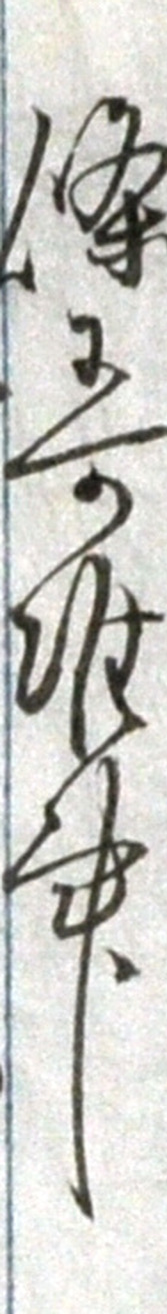條に可准事
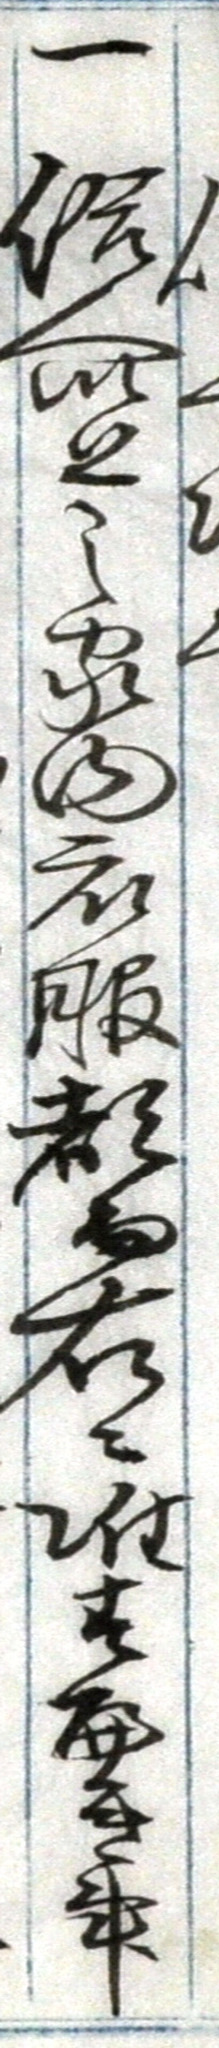一給人以上之家内衣服都而右ニ准すへき事
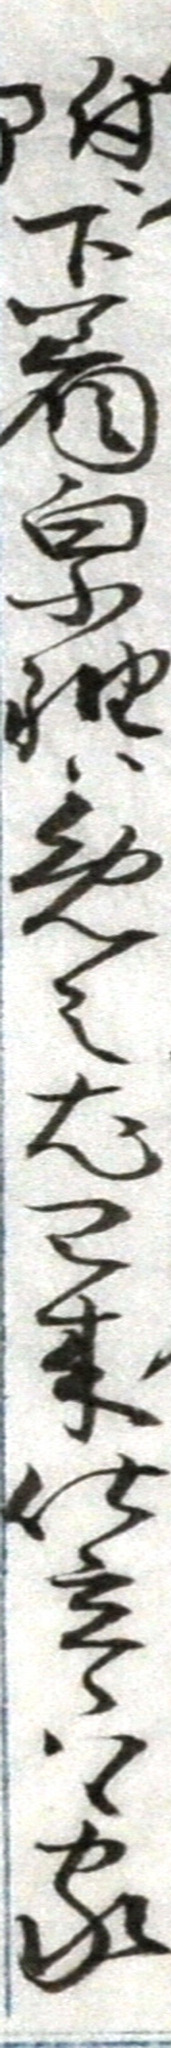附下着白小袖ハ免之尤已来仕立候ハヽ家
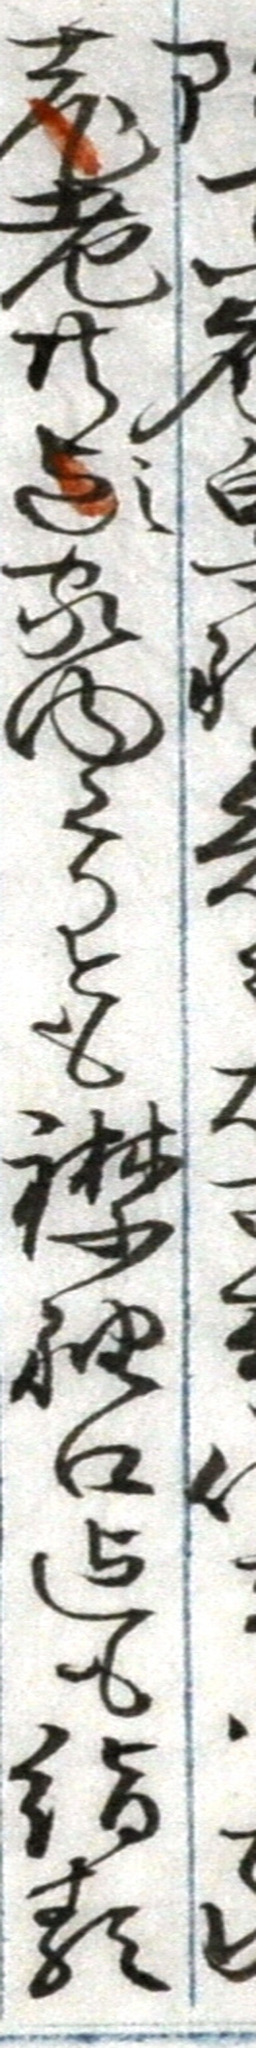老共之家内たりとも襟袖口迄も絹類
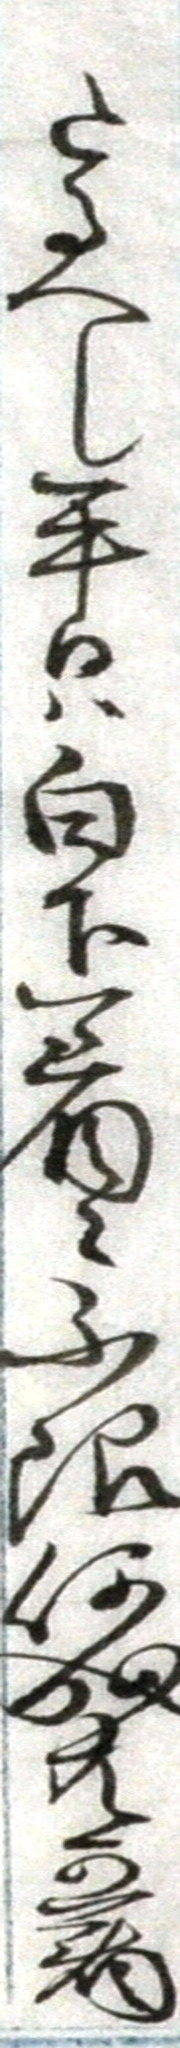たるへし平日ハ白下着ニ不限何成共可着
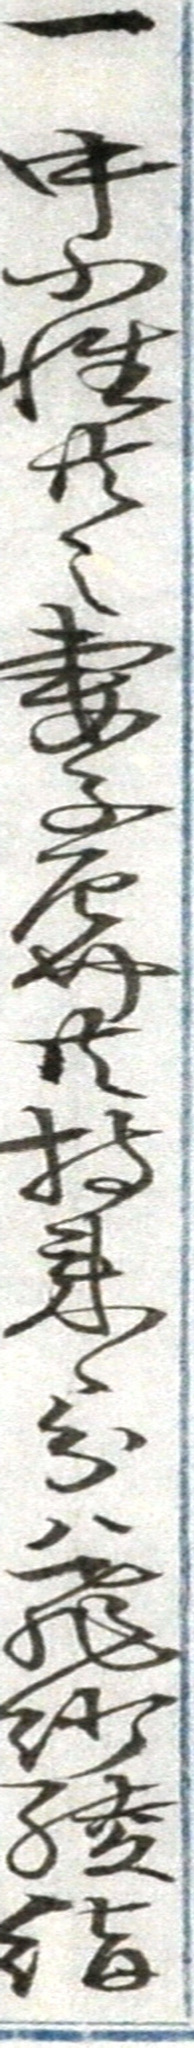一中小性共之妻子厄介共持来候分ハ飛紗綾絹
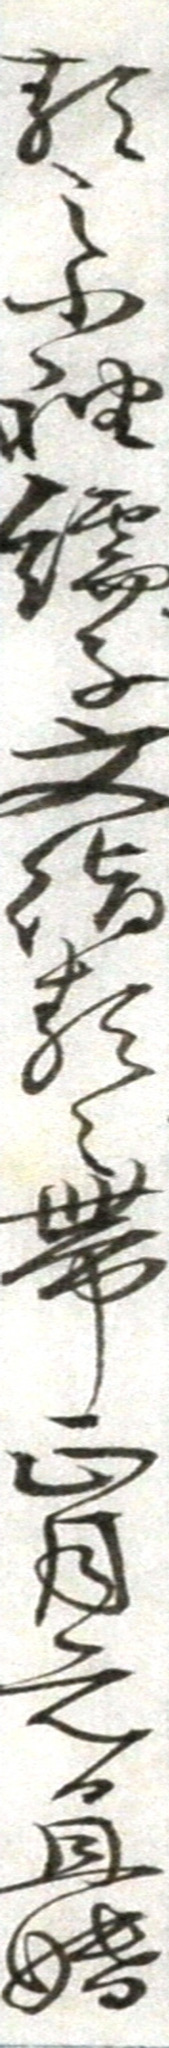類之小袖繻子文絹類之帯正月元日且婚
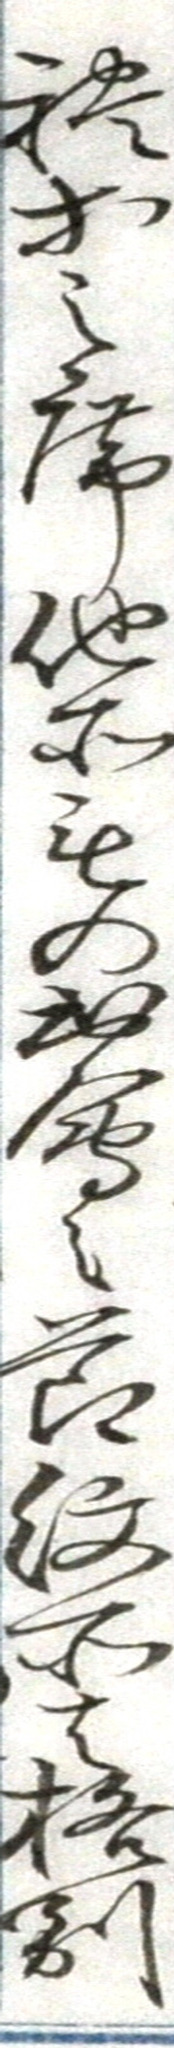礼等之席他所もの出会之節紋所は格別
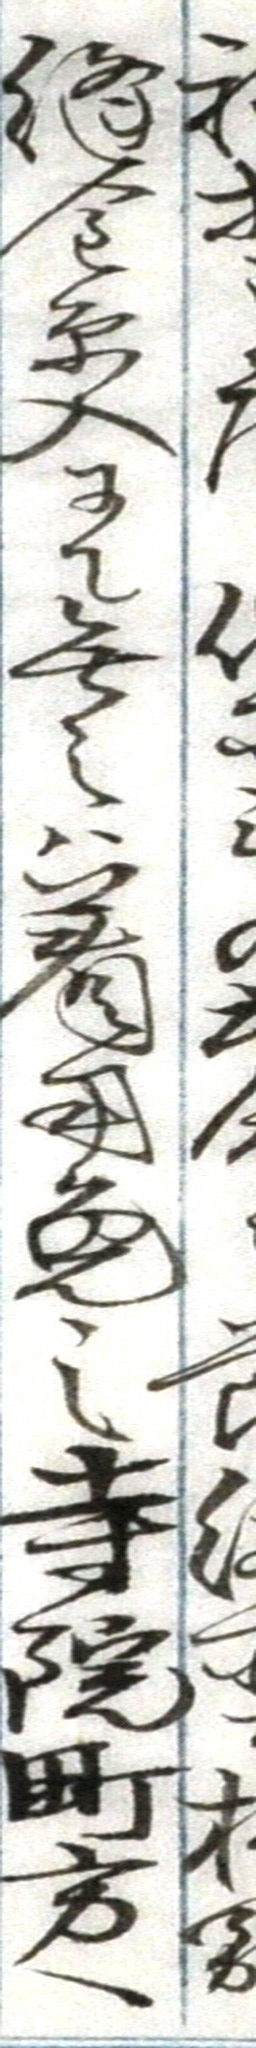縫金糸入にて無之ハ着用免之寺院町方へ
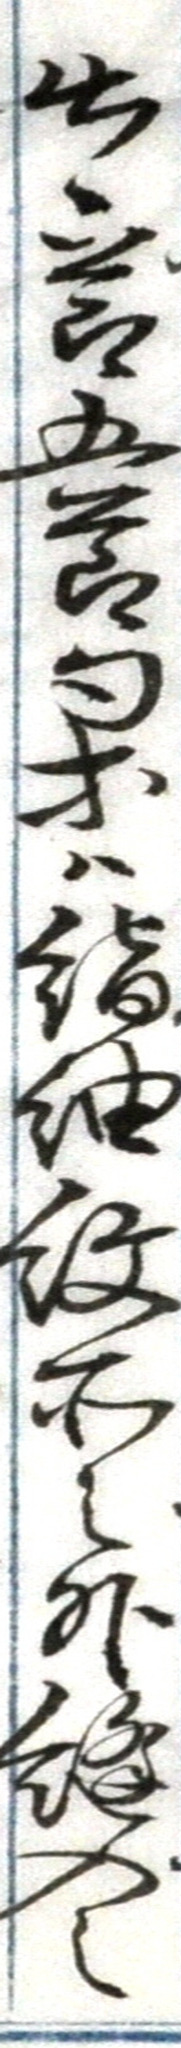出候節五節句等ハ絹紬紋所之外縫入之
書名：頼由公（源隆院殿）御定
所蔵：伊那市立高遠町図書館・合同会社AMANE
